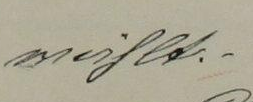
wählt.
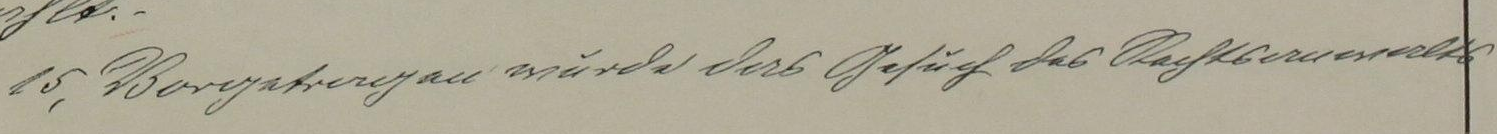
15. Vorgetragen wurde das Gesuch des Rechtsanwalts
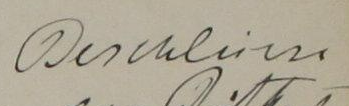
Beschlüsse
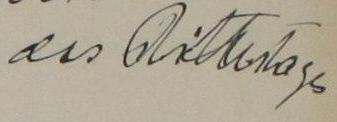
des Rittertages
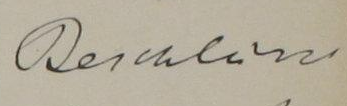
Beschlüsse
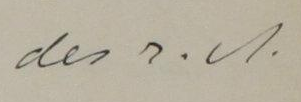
des r. A.
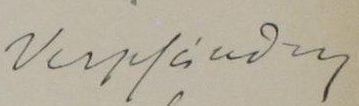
Verpfändung
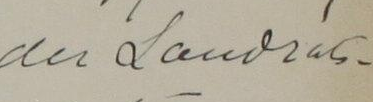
der Landrats-
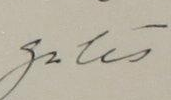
guter
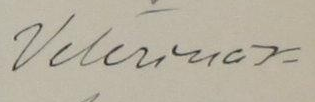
Veterinär-
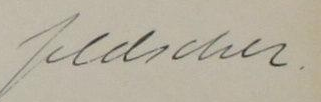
feldscher
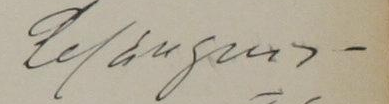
Gefängnis-
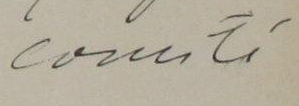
comité
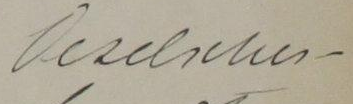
Oeselscher
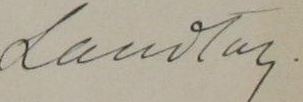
Landtag
